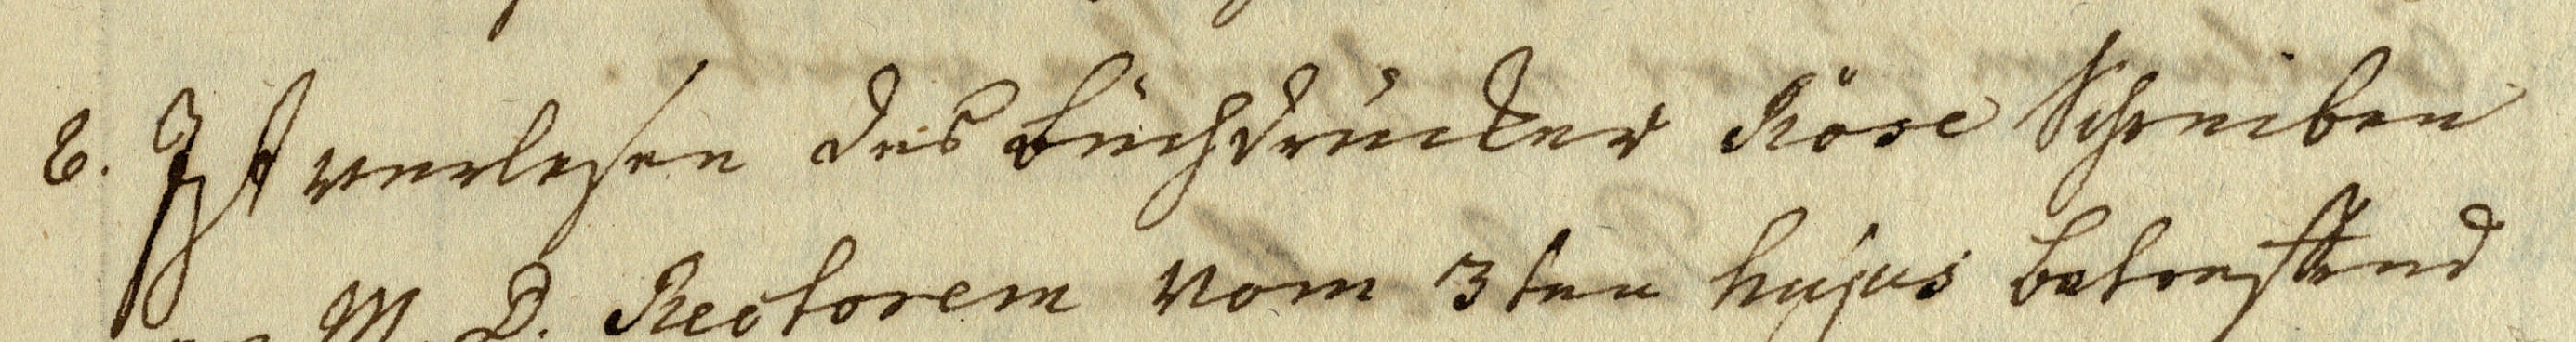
8. Ist verlesen des Buchdrucker Röse Schreiben
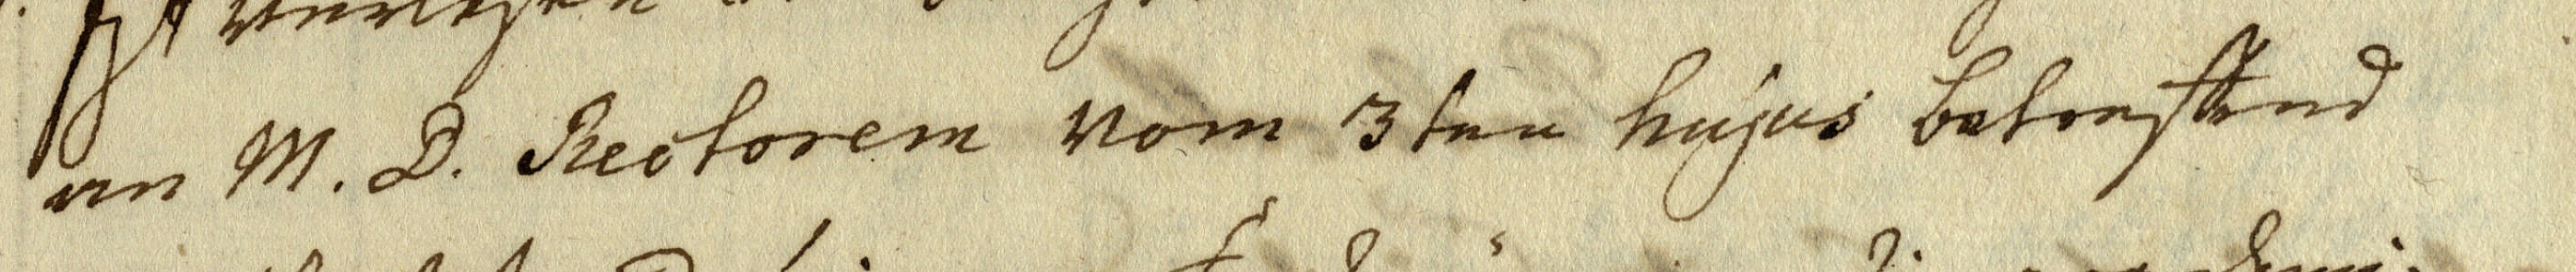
an M. D. Rectorem vom 3 ten hujus betreffend
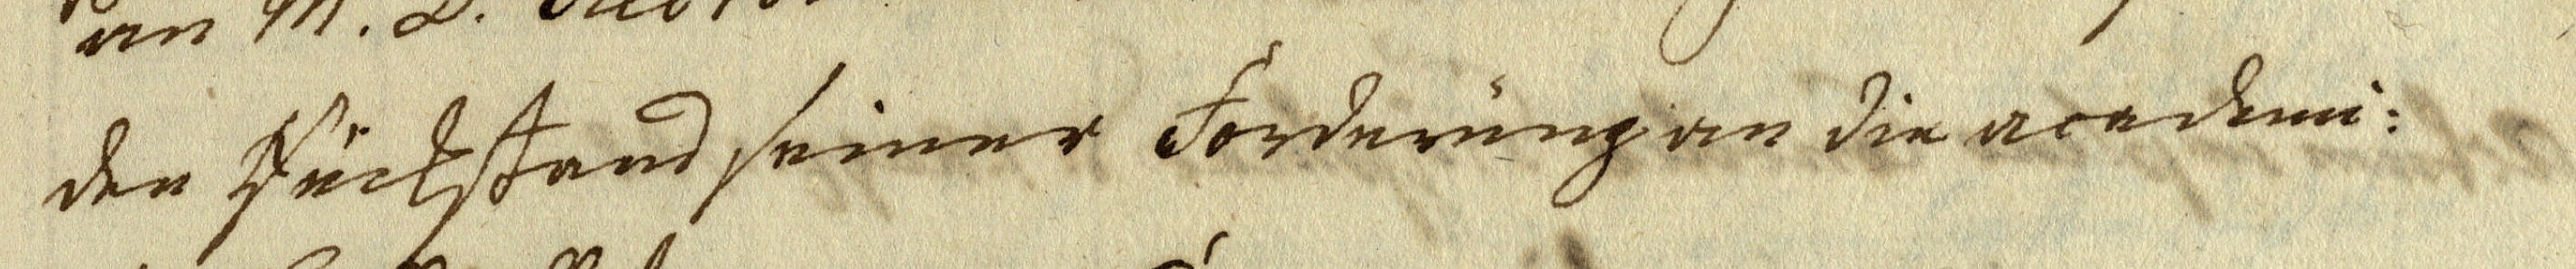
den Rückstand seiner Forderung an die academi¬
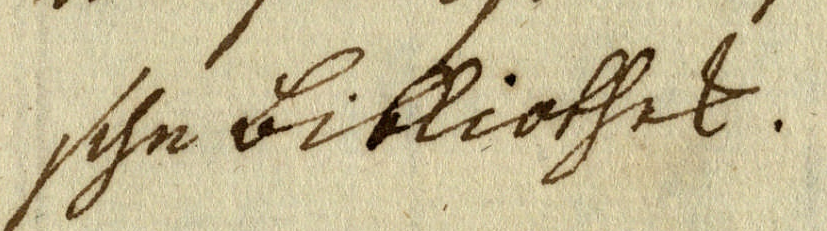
sche Bibliothek.
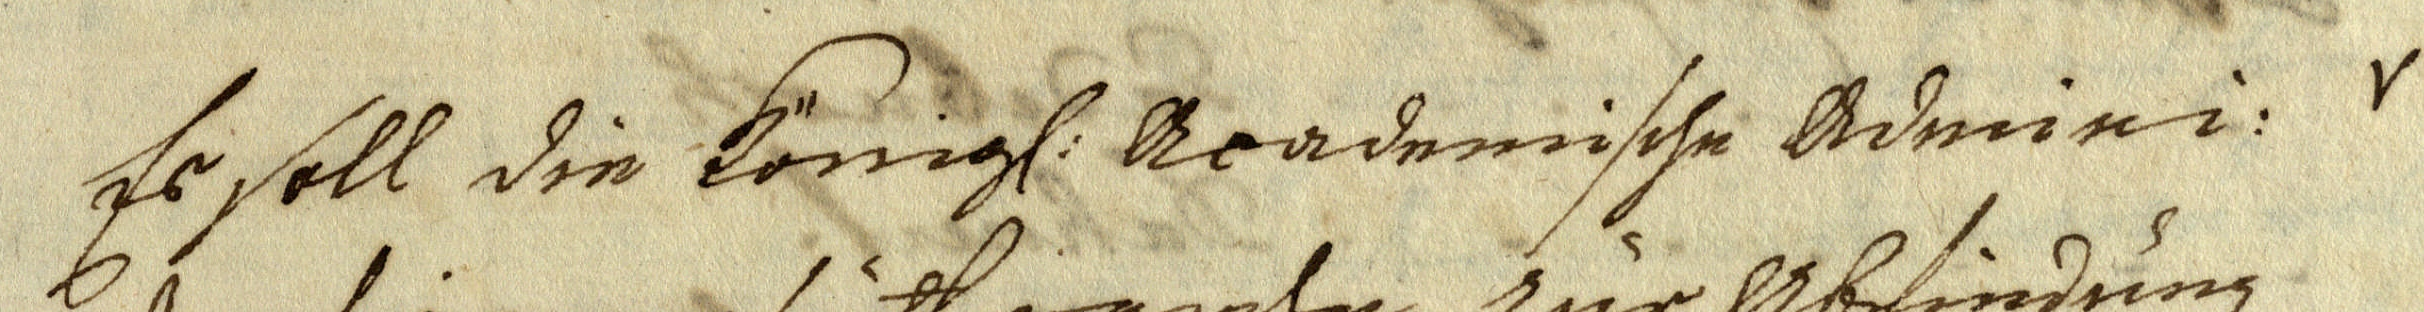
Es soll die Königl. Academische Admini¬
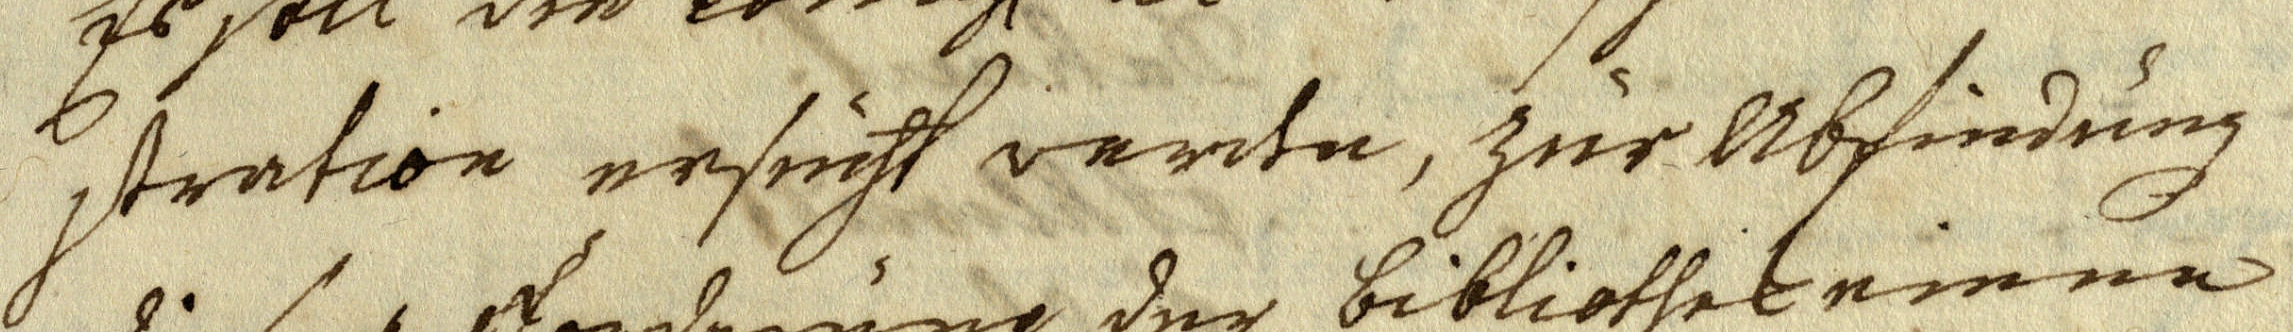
stration ersucht werden, zur Abfindung
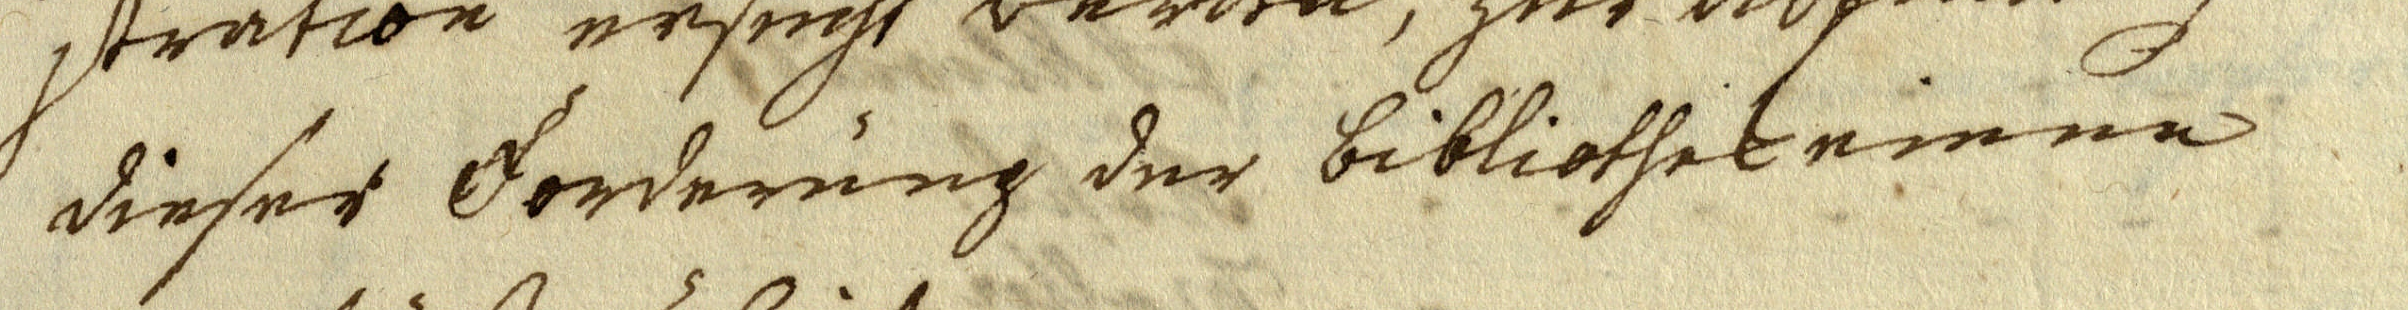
dieser Forderung der Bibliothek einen
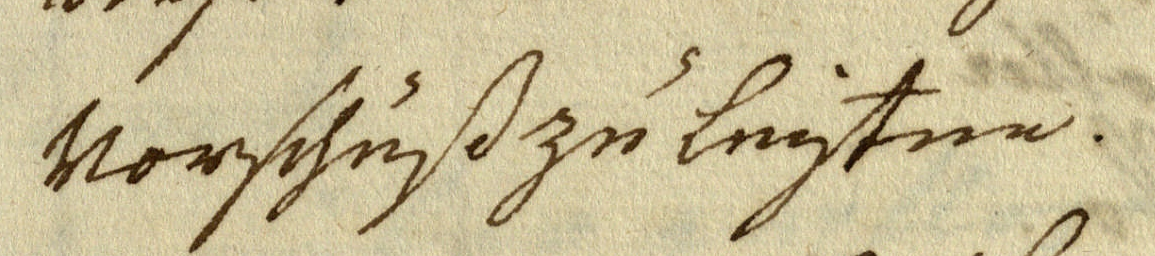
Vorschuß zu leisten.
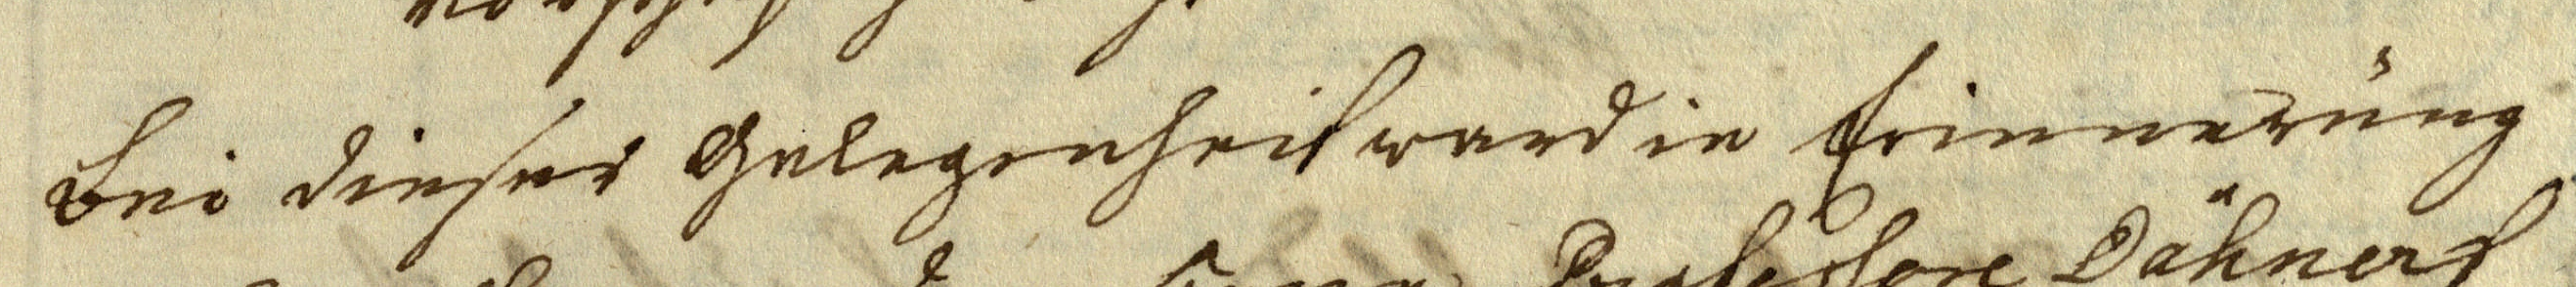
Bei dieser Gelegenheit ward in Erinnerung
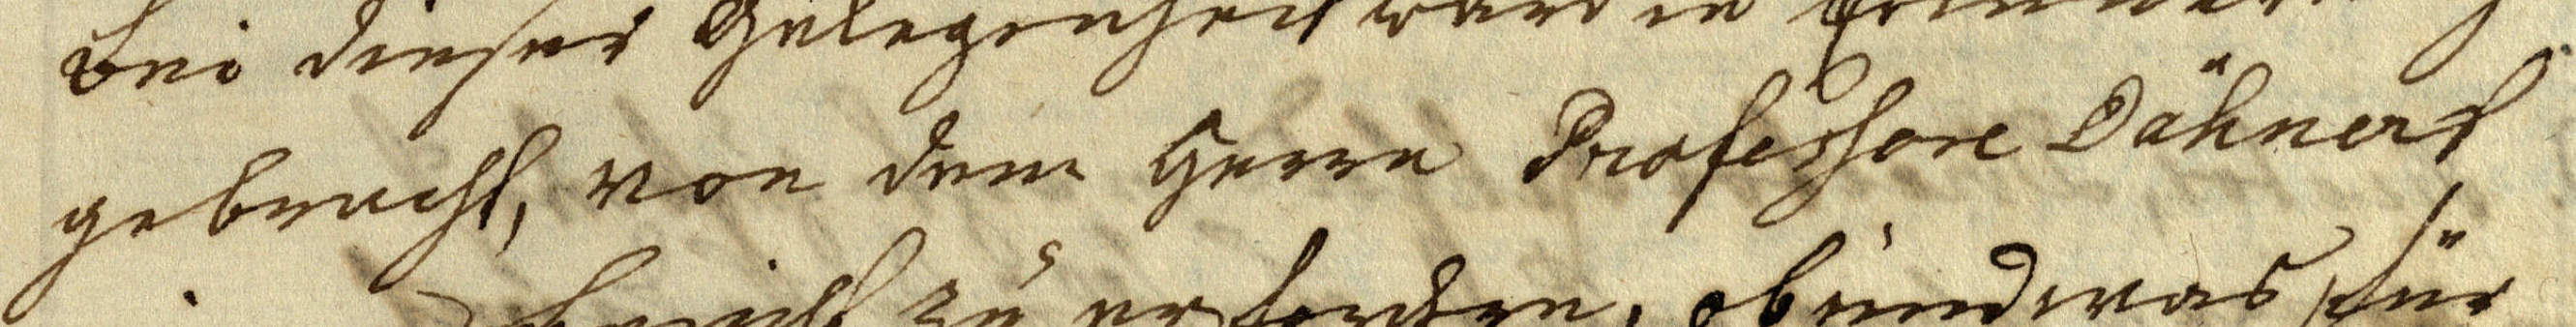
gebracht, von dem Herrn Porfessore Dähnert
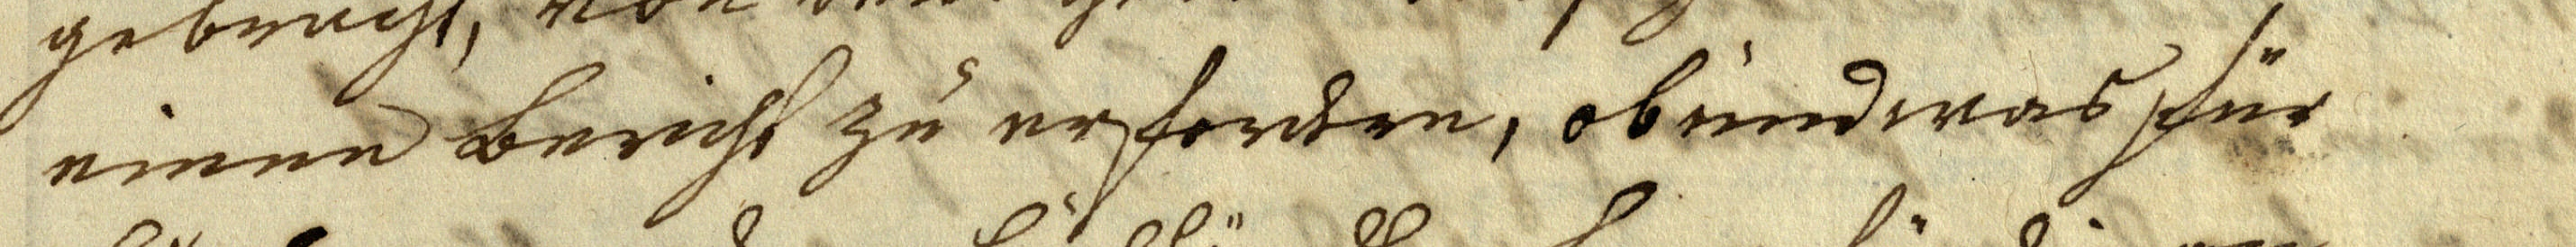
einen Bericht zu erfordern, ob und was für
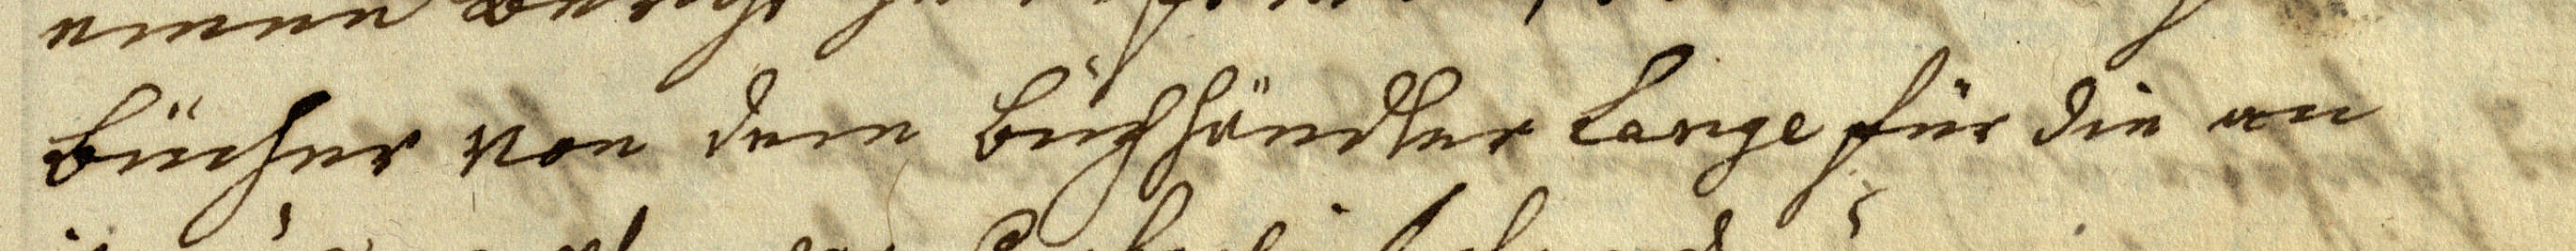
Bücher von dem Buchhändler Lange für die an
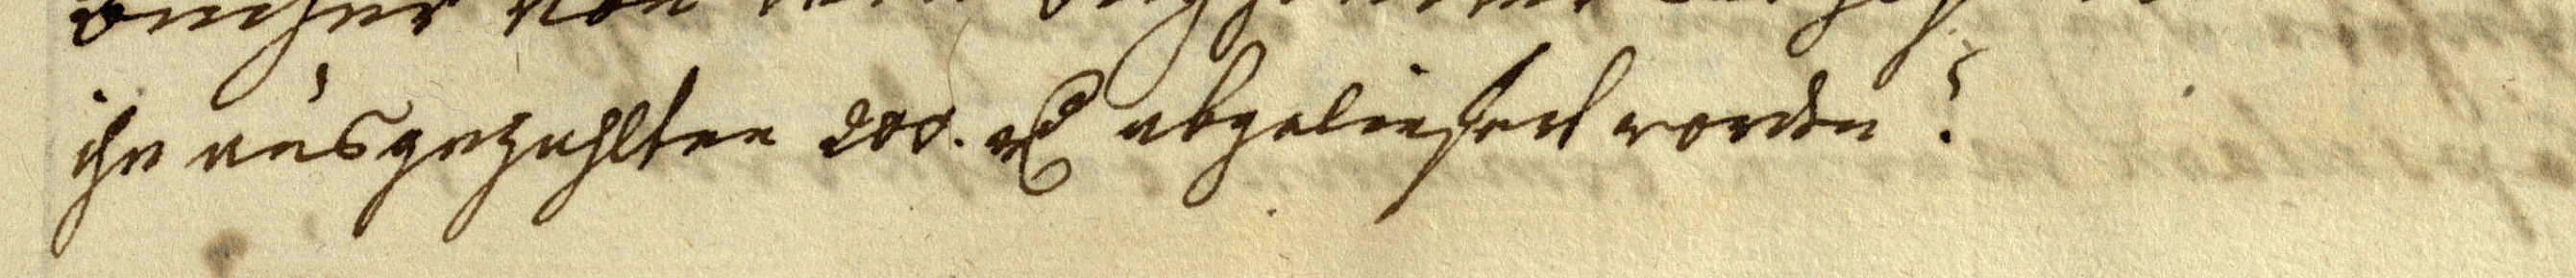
ihn ausgezahlten 200 r. abgeleistet worden!
